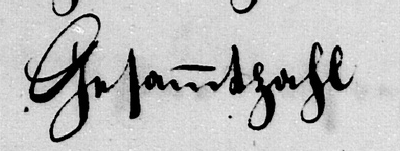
Gesammtzahl
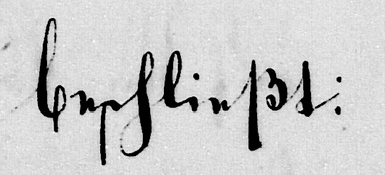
beschließt:
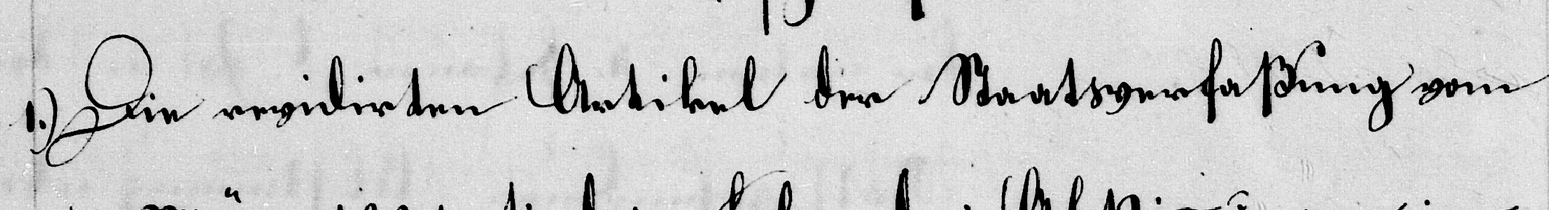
1.) Die revidirten Artikel der Staatsverfaßung vom
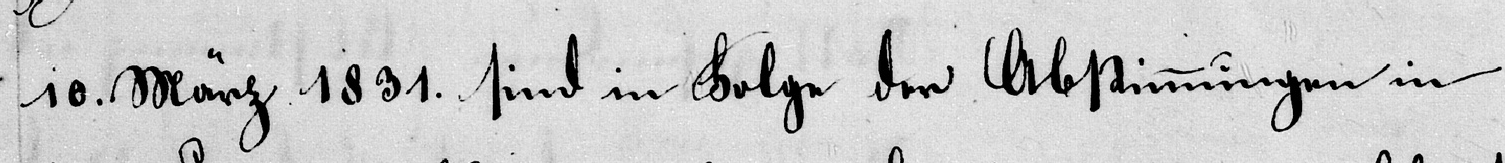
10. März 1831. sind in Folge der Abstimmungen in
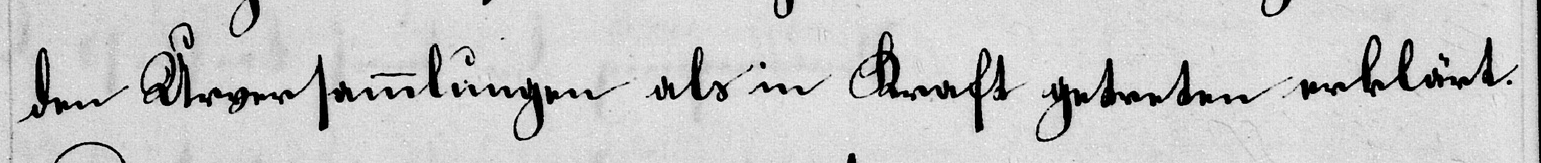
den Urversammlungen als in Kraft getreten erklärt.
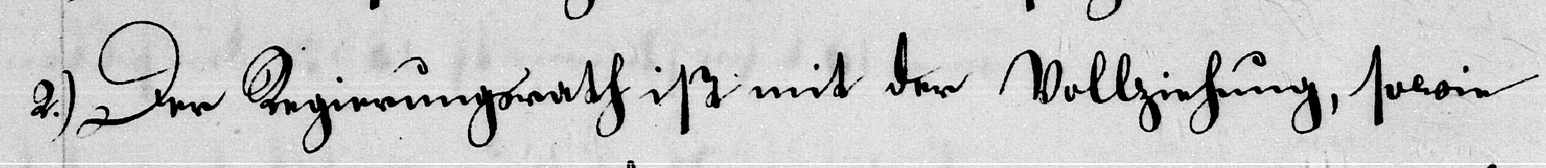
2.) Der Regierungsrath ist mit der Vollziehung, sowie
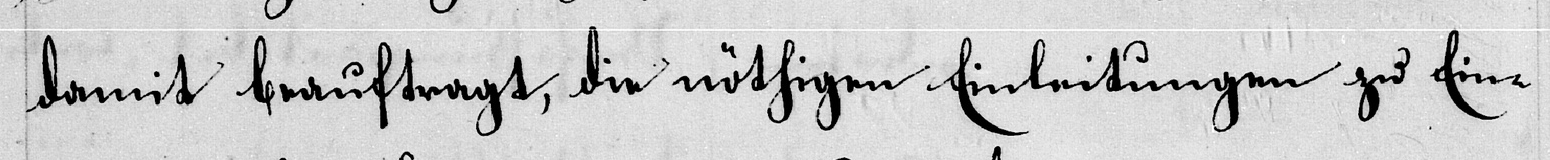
damit beauftragt, die nöthigen Einleitungen zu Ein¬
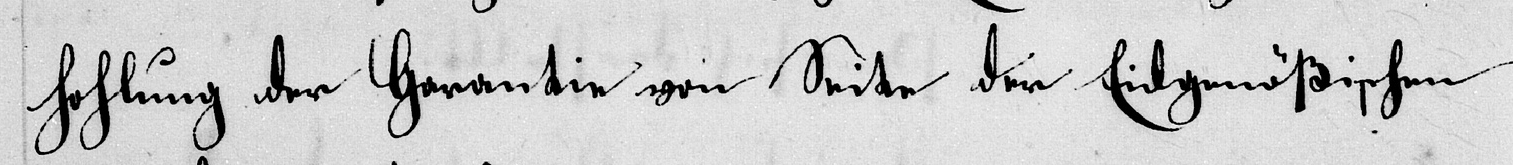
hohlung der Garantie von Seite der Eidgenößischen
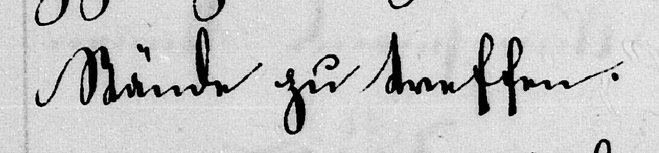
Stände zu treffen.
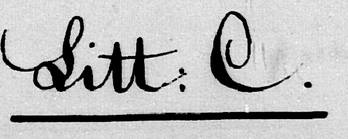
Litt: C.
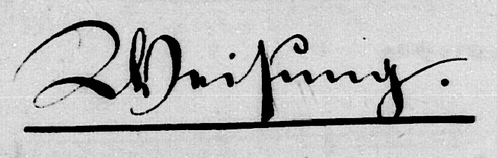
Weisung.
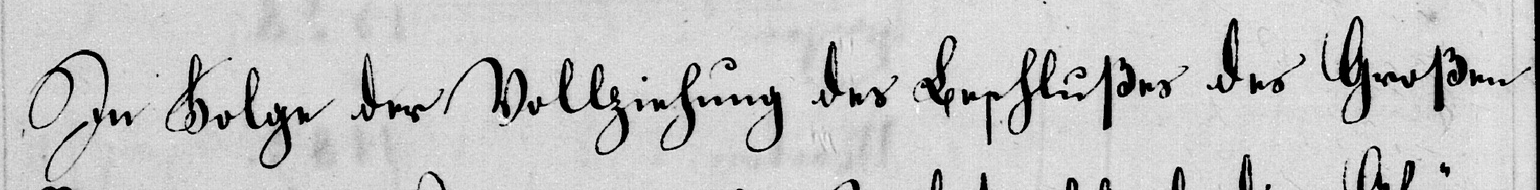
In Folge der Vollziehung des Beschlußes des Großen
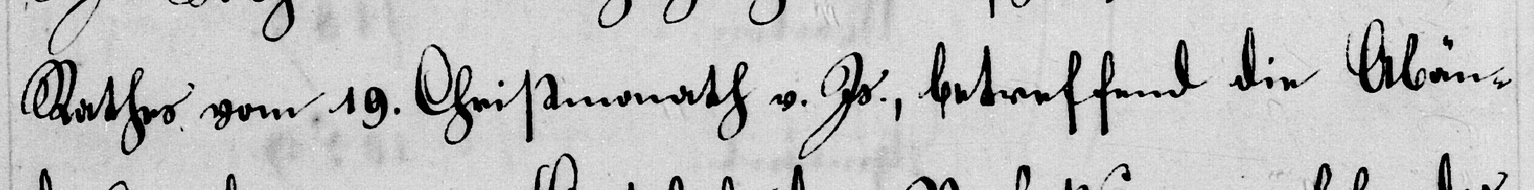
Rathes vom 19. Christmonath v. Js., betreffend die Abän¬
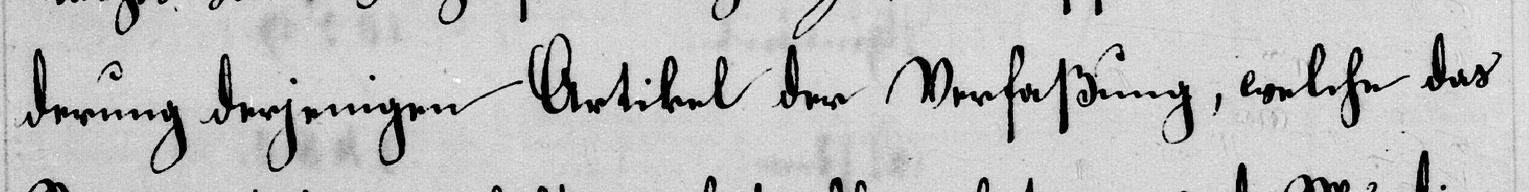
derung derjenigen Artikel der Verfaßung, welche das
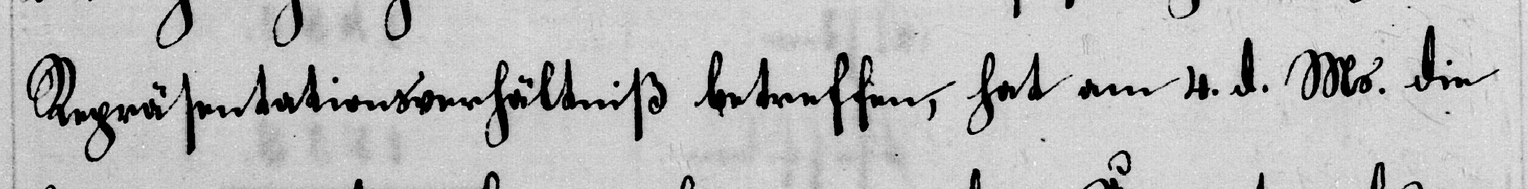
Repräsentationsverhältniß betreffen, hat am 4. d. Ms. die
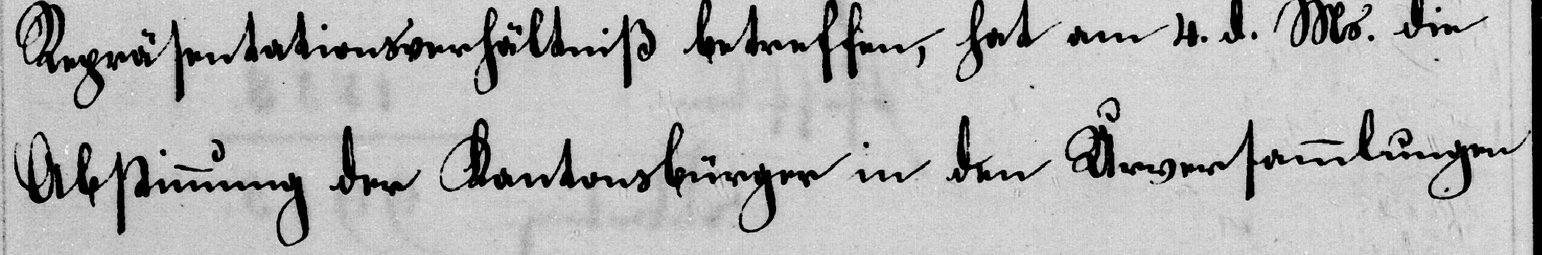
Abstimmung der Kantonsbürger in den Urversammlungen
